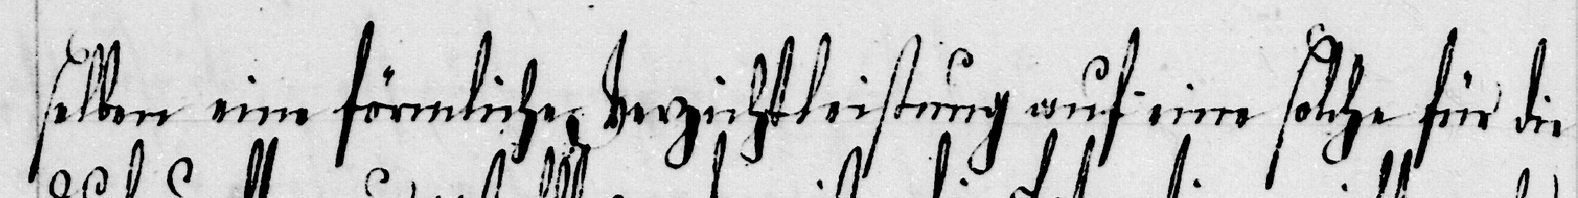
selben eine förmliche Verzichtleistung auf eine solche für d¬
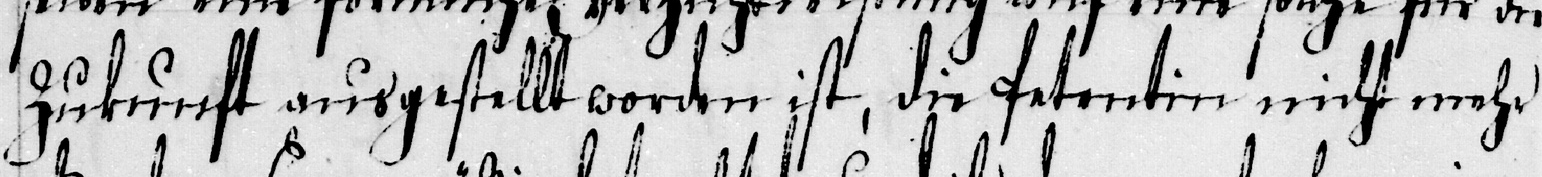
Zukunft ausgestellt worden ist, die Petentin nicht mehr
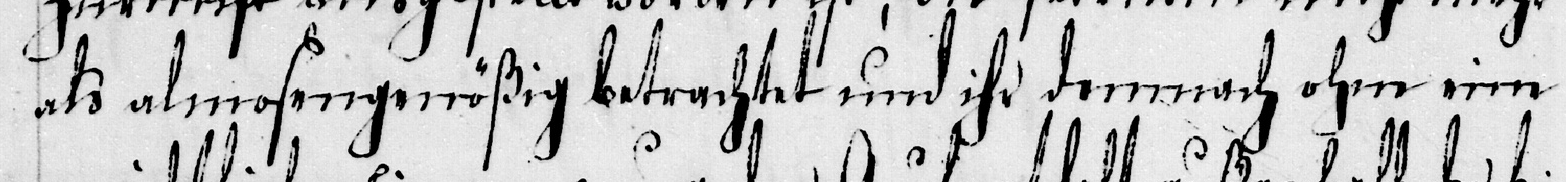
als almosengenößig betrachtet und ihr demnach ohne eine
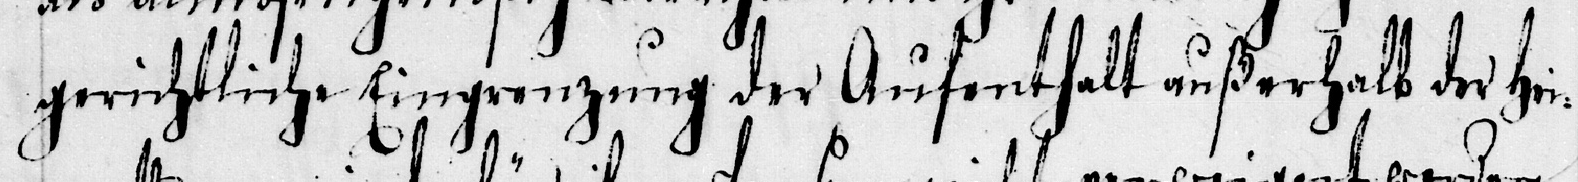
gerichtliche Eingrenzung der Aufenthalt außerhalb der He¬
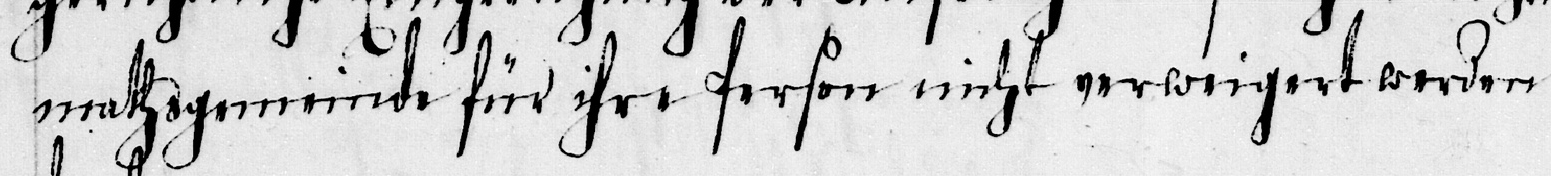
imathsgemeinde für ihre Person nicht verweigert werden
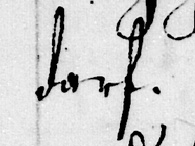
darf.
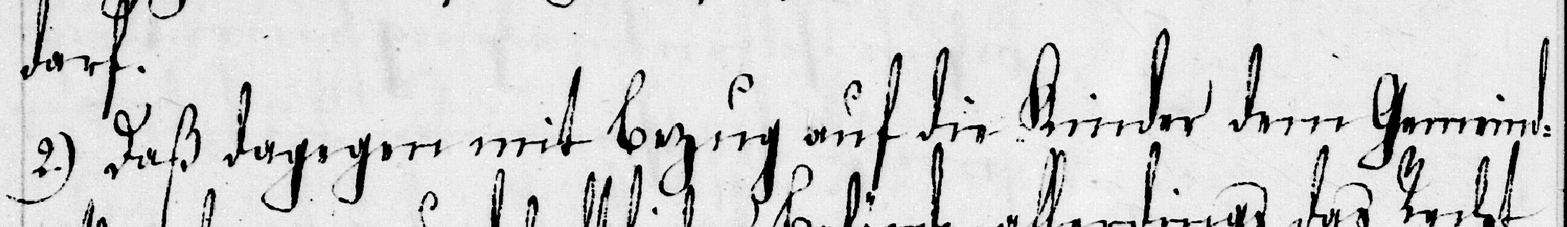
2.) Daß dagegen mit Bezug auf die Kinder dem Gemeind¬
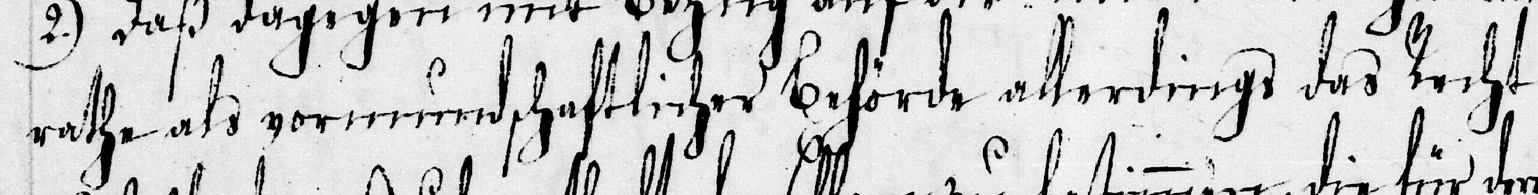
rathe als vormundschaftlicher Behörde allerdings das Recht
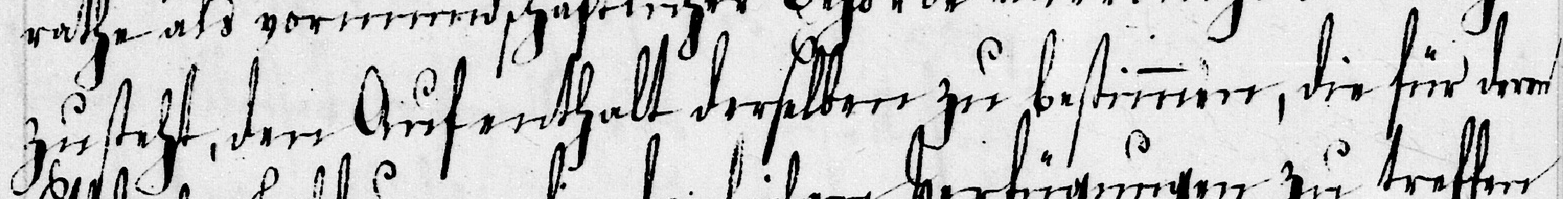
zusteht, den Aufenthalt derselben zu bestimmen, die für de¬
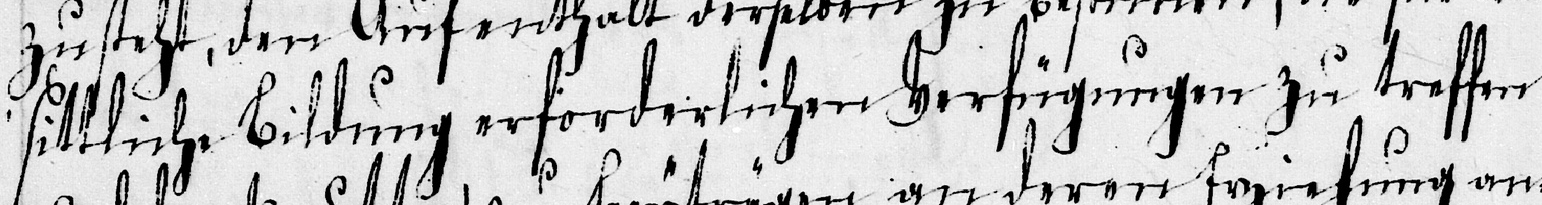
sittliche Bildung erforderlichen Verfügungen zu treffen
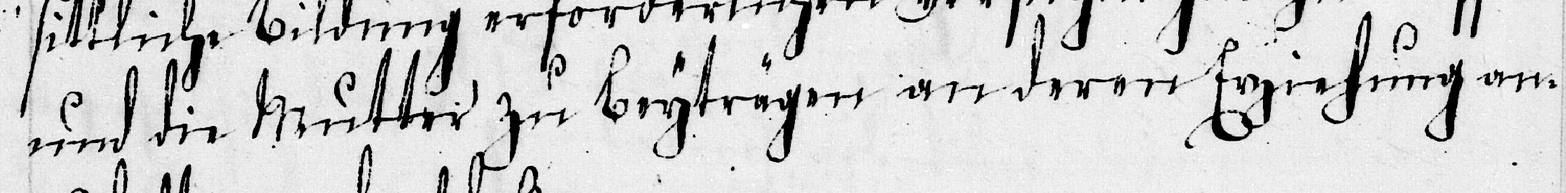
und die Mutter zu Beyträgen an deren Erziehung an¬
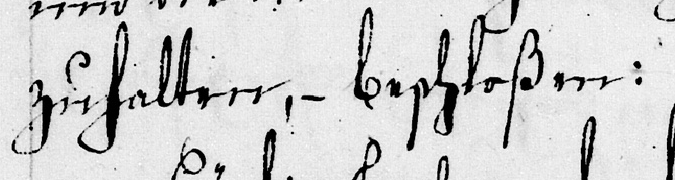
zuhalten,– beschloßen:
